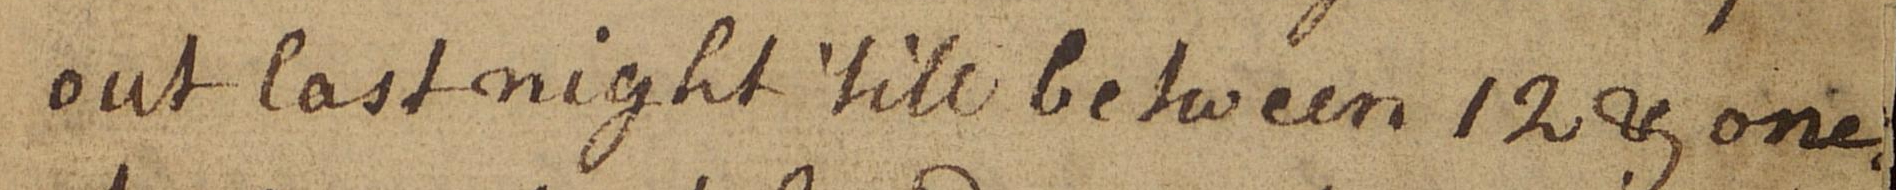out last night 'till between 12 & one
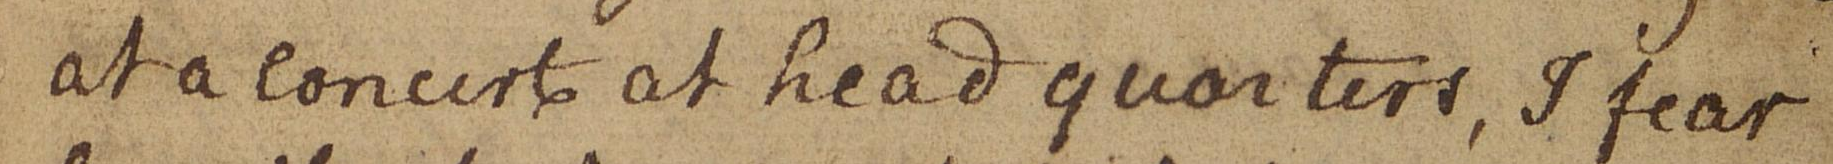at a concert at head quarters, I fear
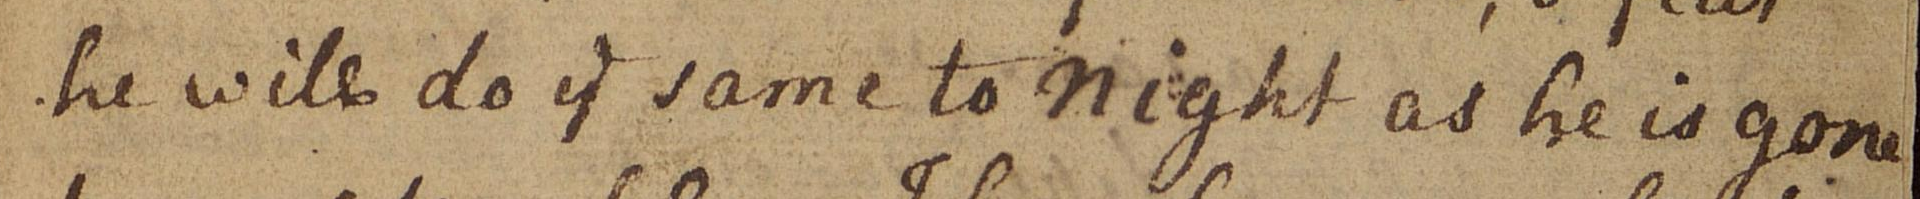he will do y^e same to night as he is gone
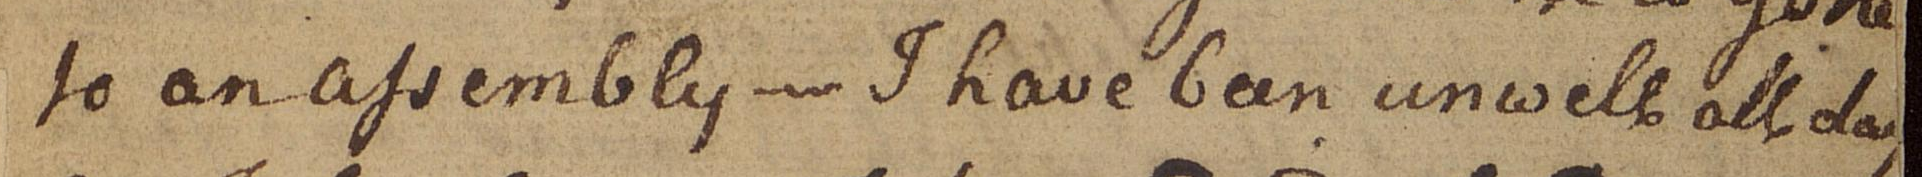to an assembly- I have been unwell all day
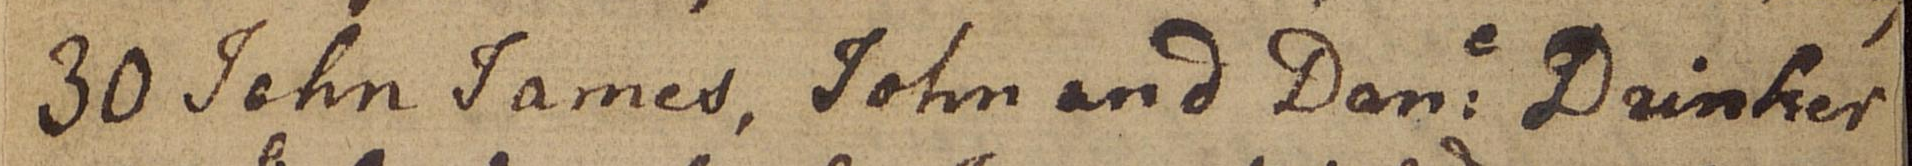30 John James, John and Dan^l: Drinker
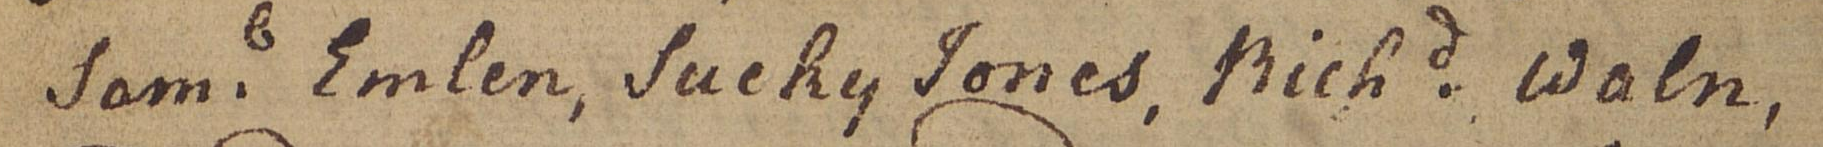Sam^l. Emlen, Sucky Jones, Rich^d. Waln,
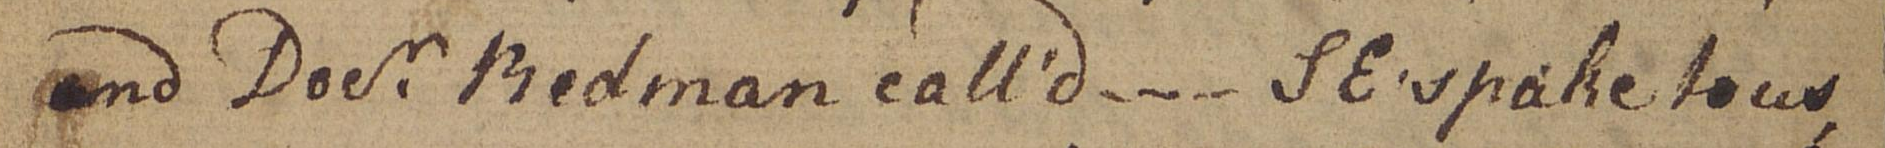and Doc^r. Redman call'd- SE spake to us
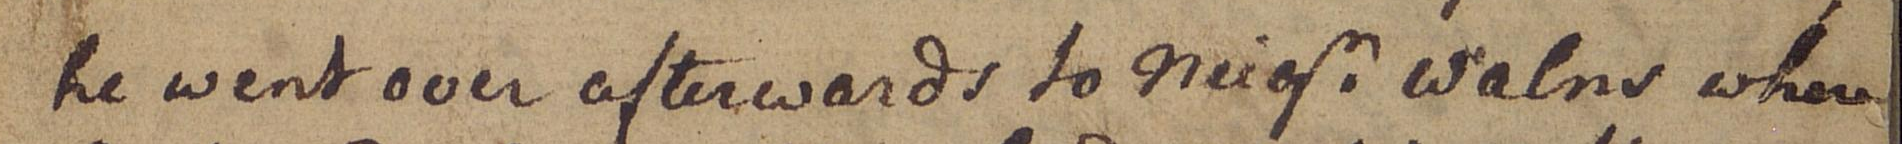he went over afterwards to Neig^r. Walns where
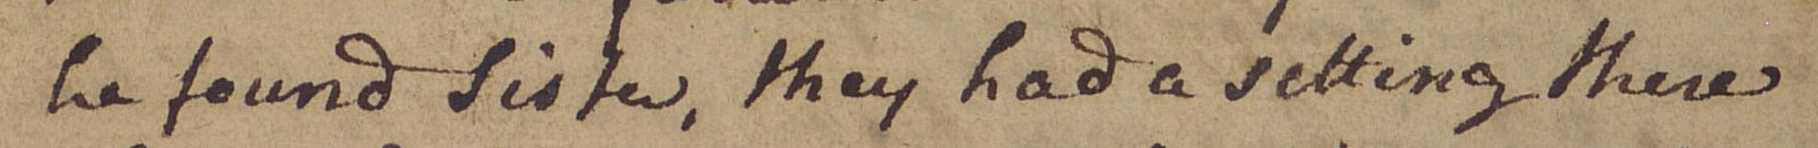he found Sister, they had a setting there
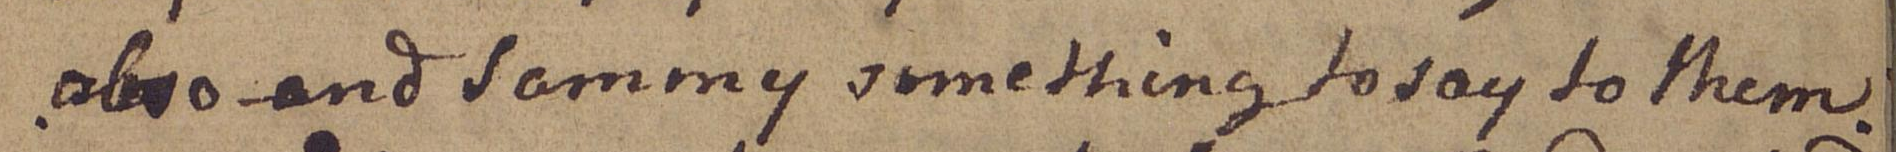also and Sammy something to say to them.
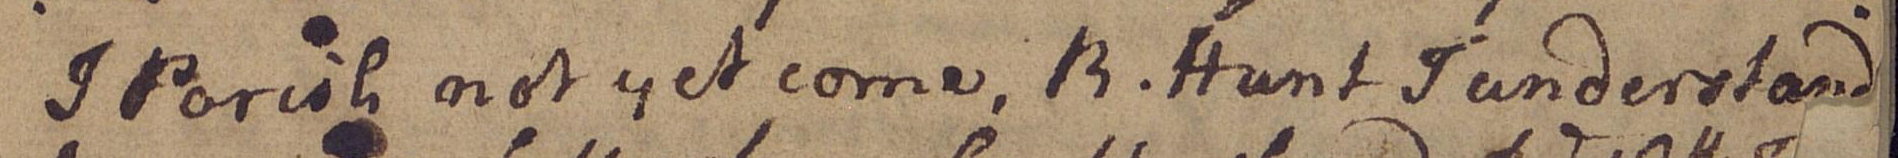J Parish not yet come, R. Hunt I understand
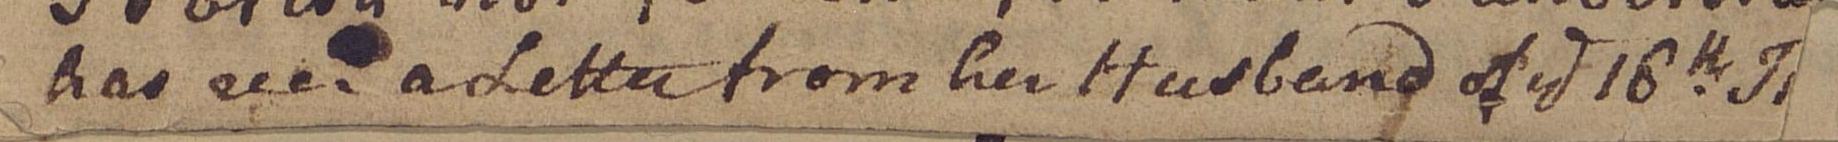has seen a Letter from her Husband of y^e 16^th Tr
